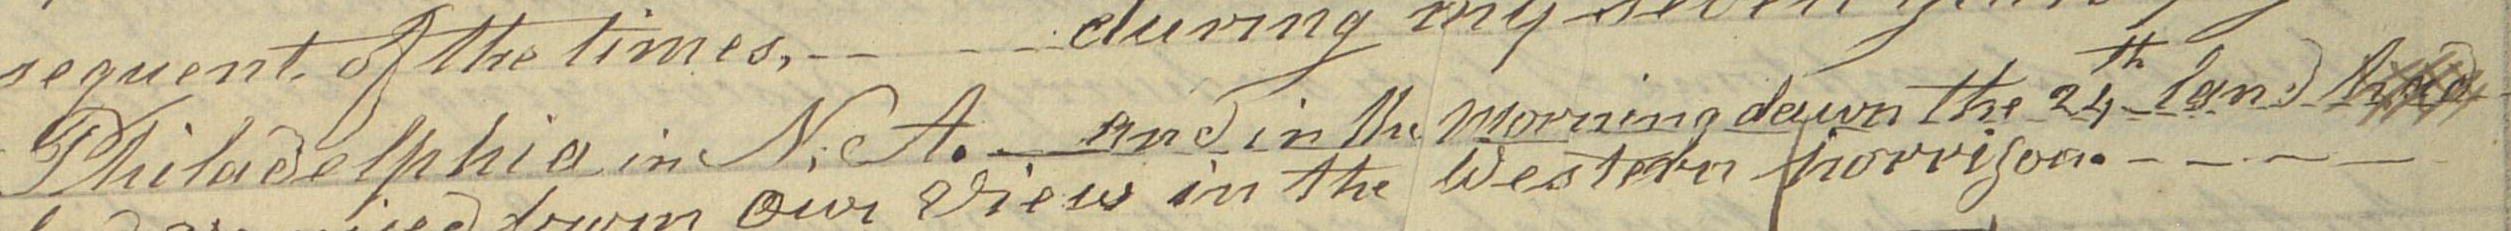Philadelphia in N.A. and in the Morning dawn the 24^th land had
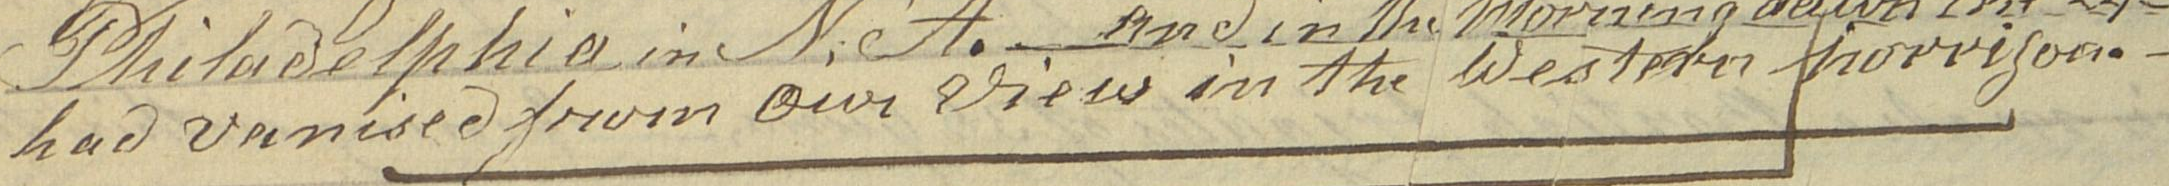had vanised from our View in the Western horrizon
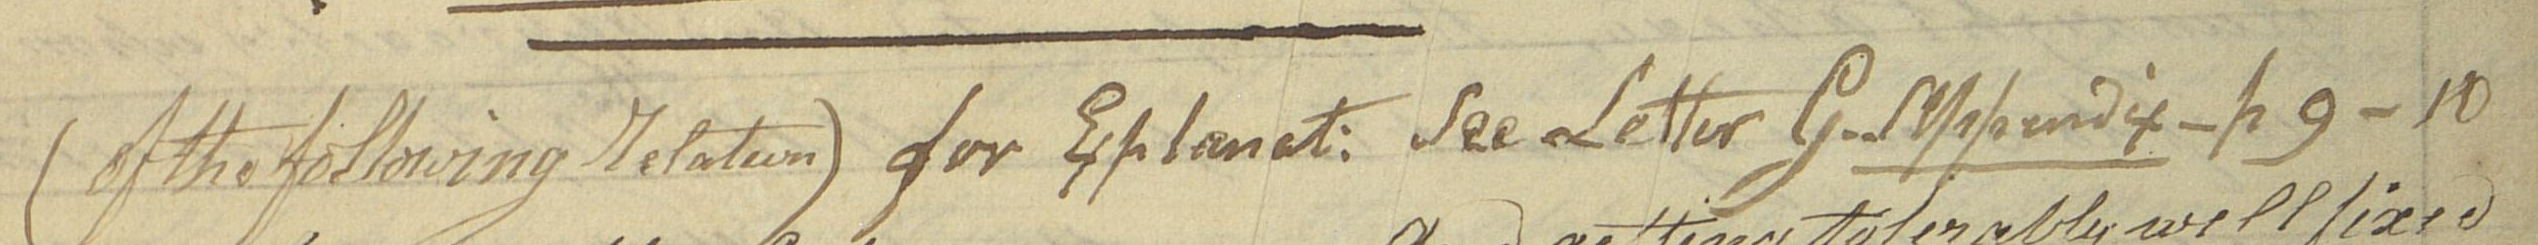(of the following Relation) for Explanat: See Letter G and Appendix p 9-10
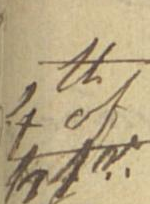4^th of
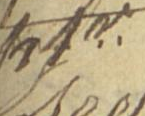nt^r
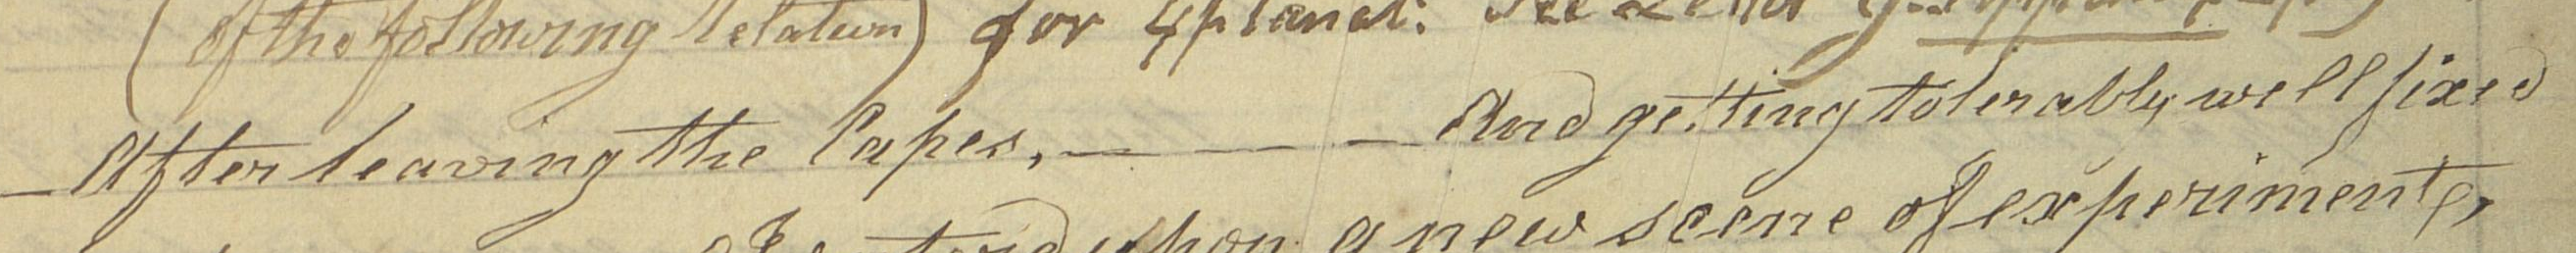After leaving the Capes.-- And getting tolerably well fixed
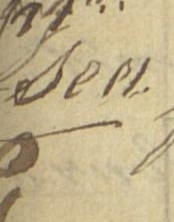Sea
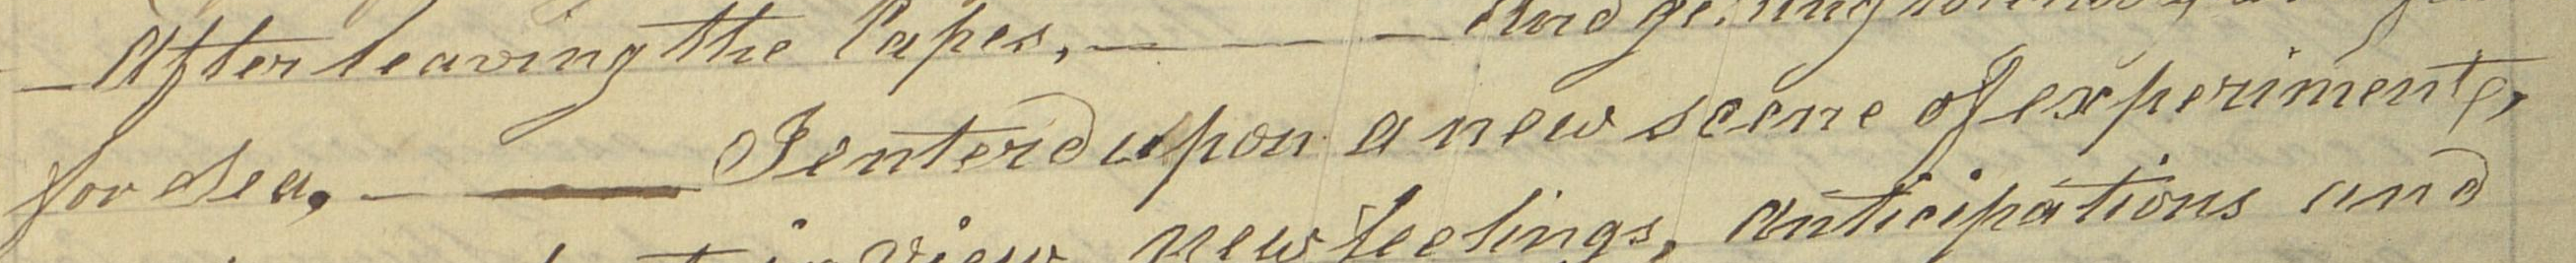for Sea, I enterd upon a new scene of experiments,
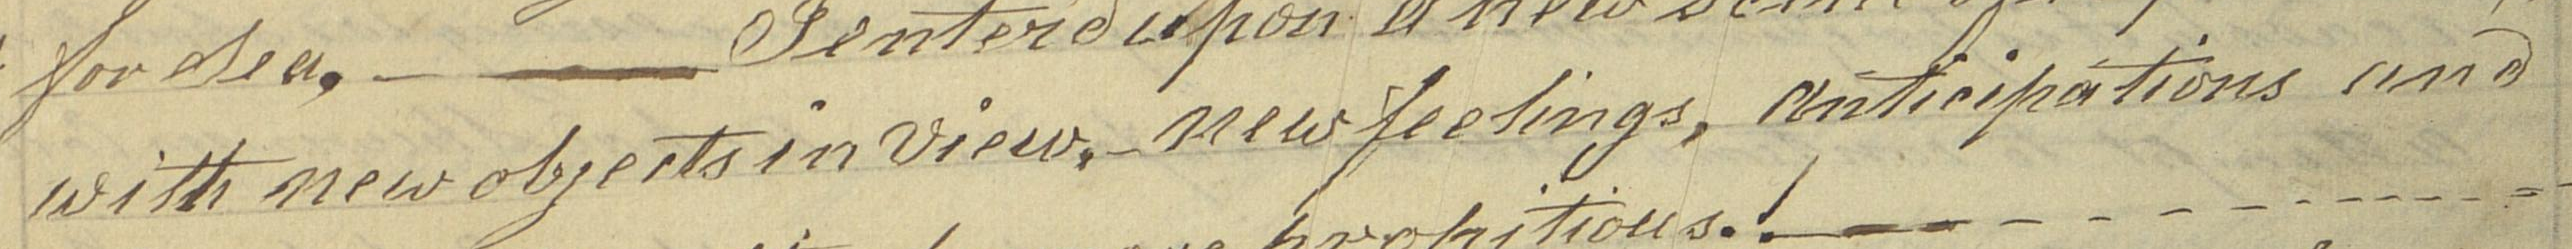with new objects in view, new feelings, anticipations and
